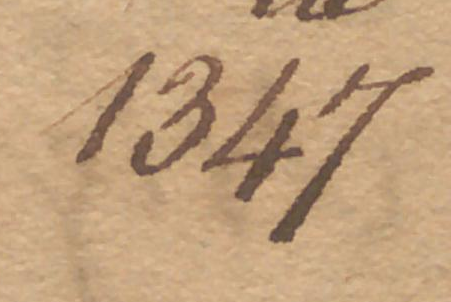1347
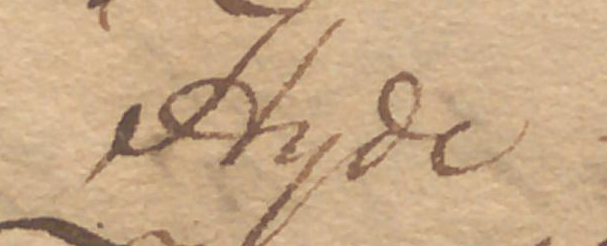Hyde
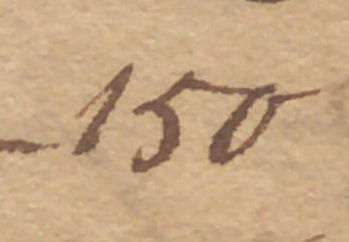150
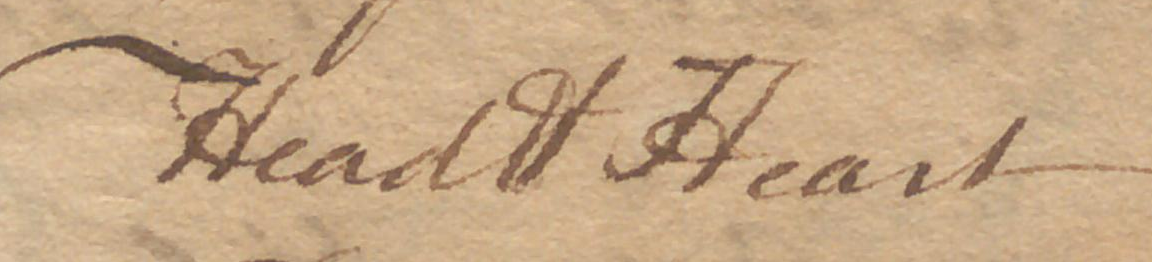Head & Heart
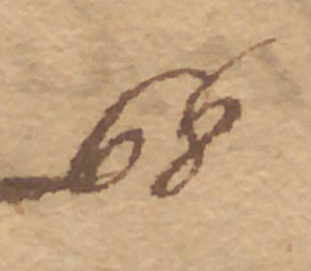68
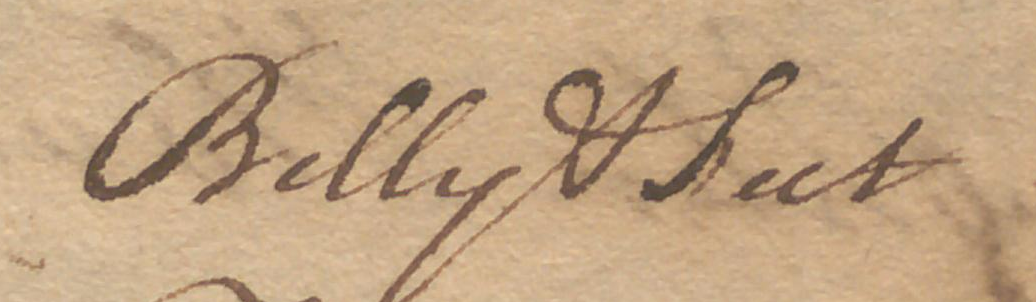Billy & but
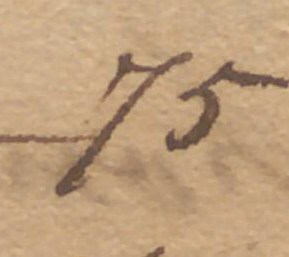75
